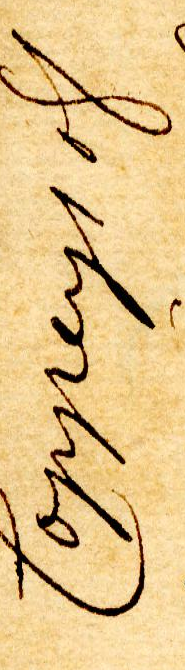Coppey of
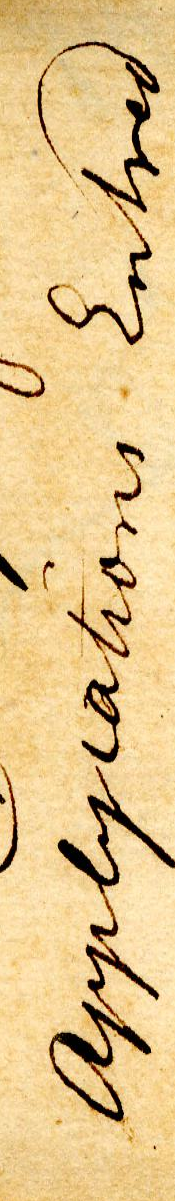Applycations Entred
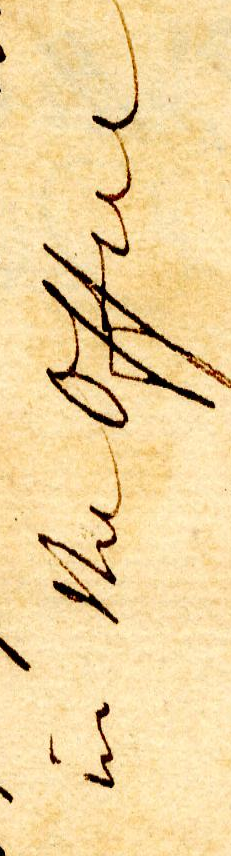in the Office
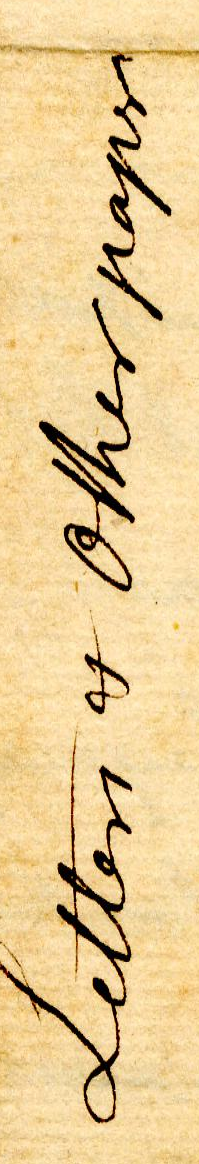Letters & other paper
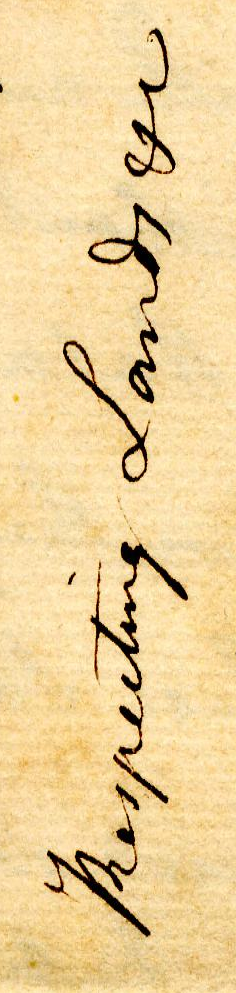Respecting Lands &c
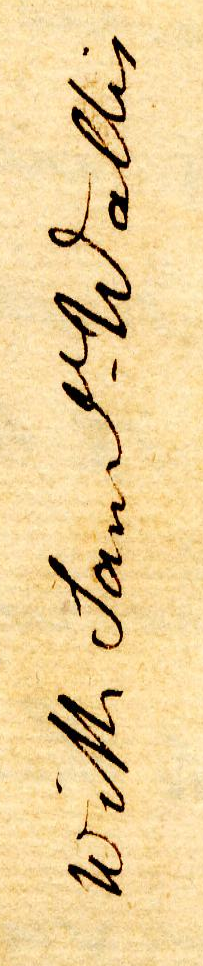with Sam^l. Wallis
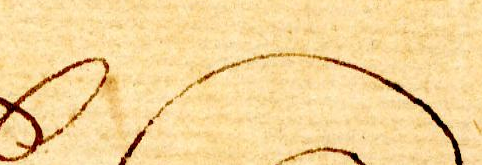To
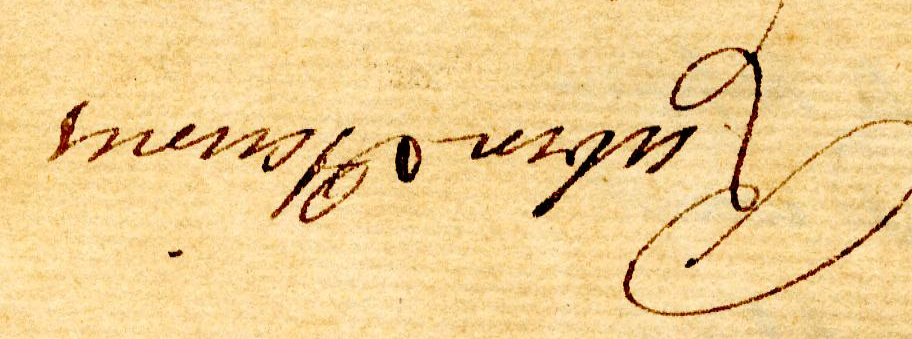Ruben Haines
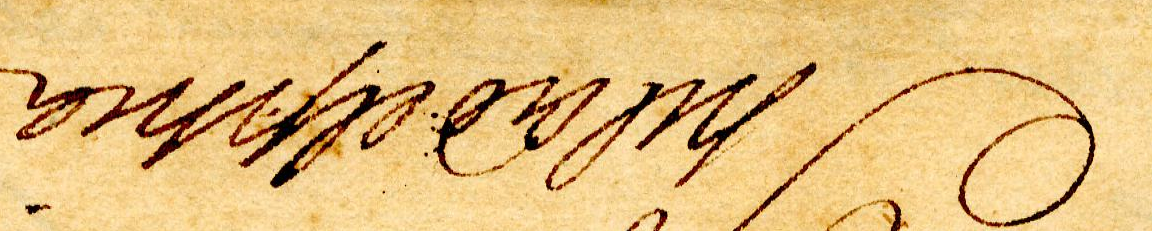Philadelphia
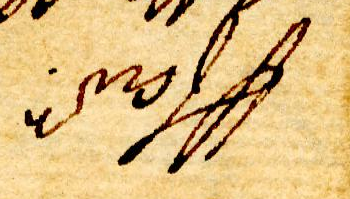per fav^r.
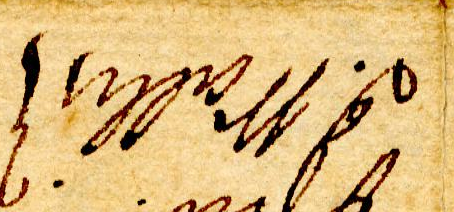J. Wallis
